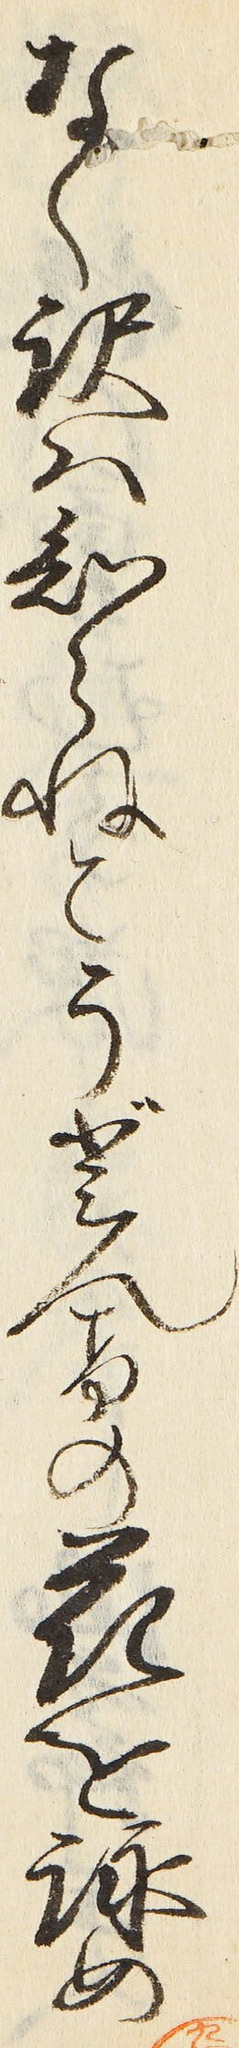なく訳ハ知らねとうどんけの花を詠め
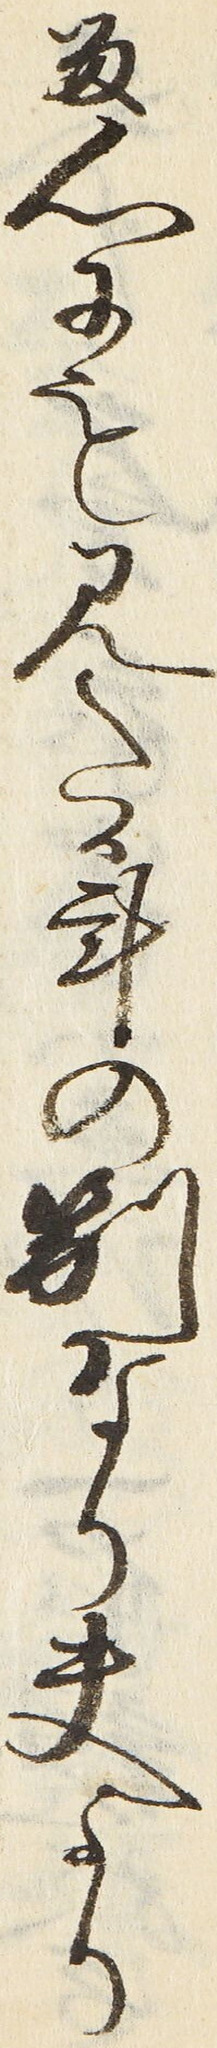る心にも見たる計の別なり夫より
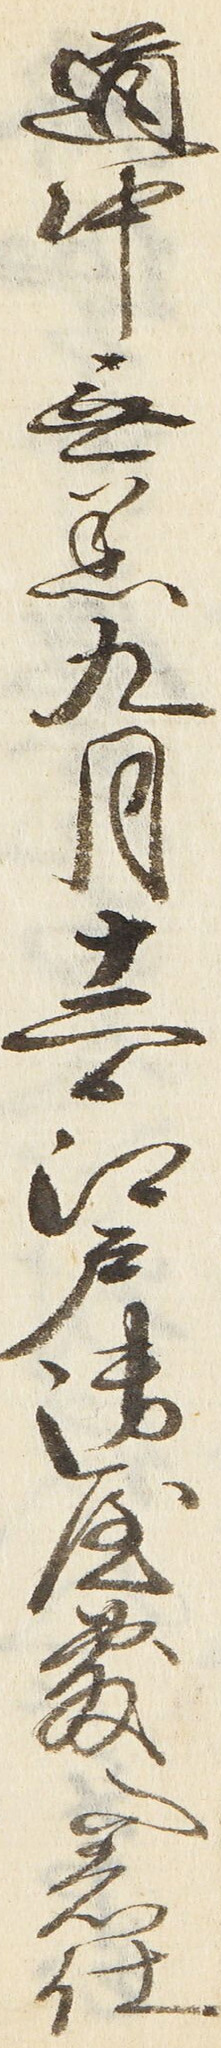道中無恙九月十二日江戸御屋敷へ差仕
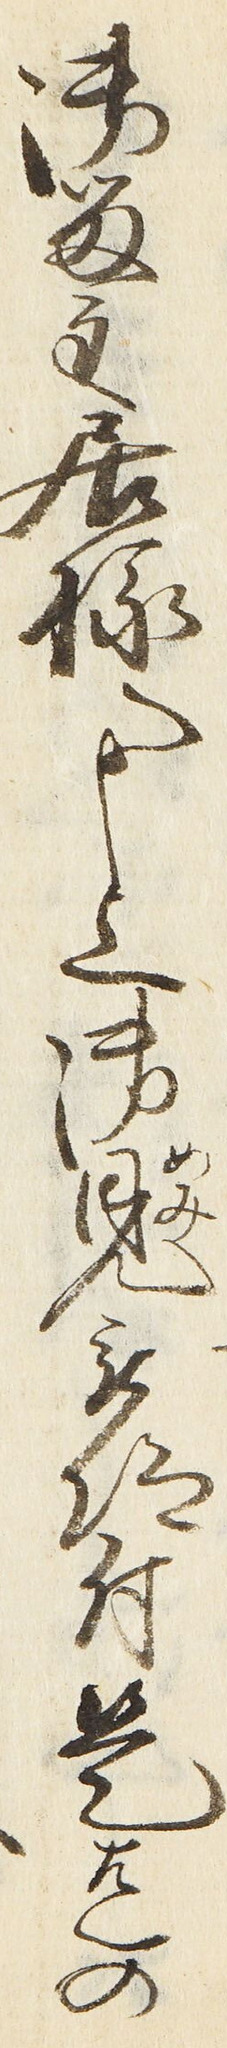御留主居様へ申上御見被仰付是迄の
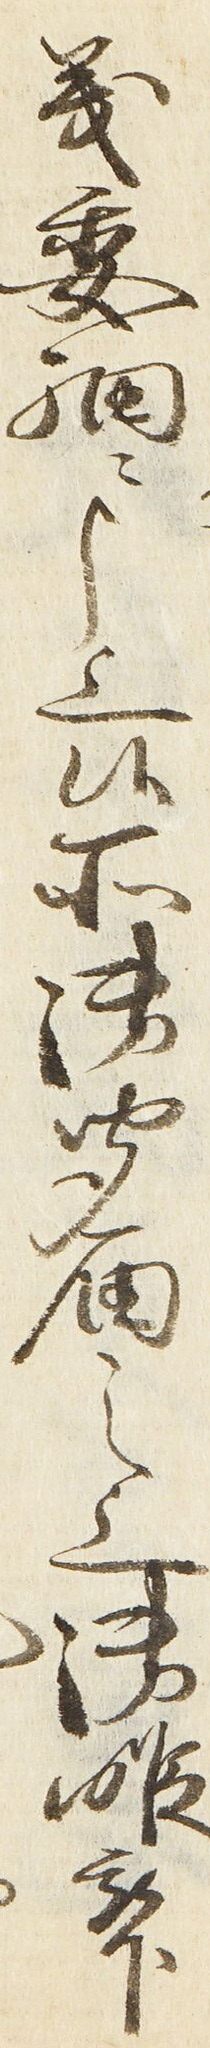義委細ニ申上候所御聞届之上御暇被下
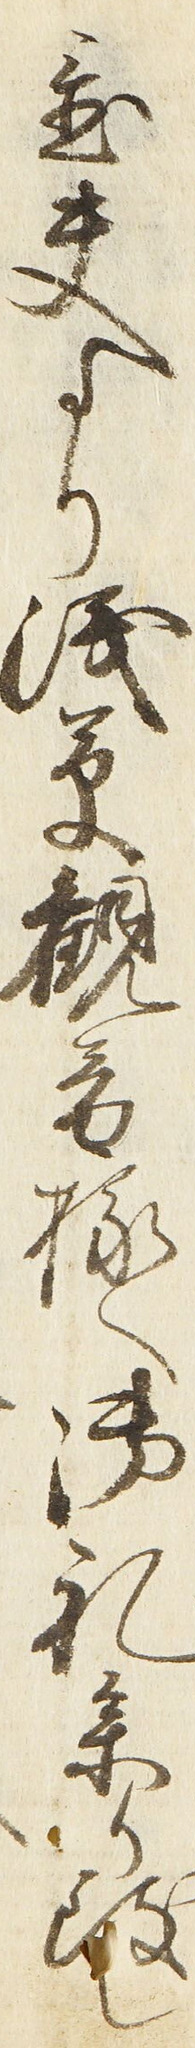置夫より浅草観音様へ御礼参り致し
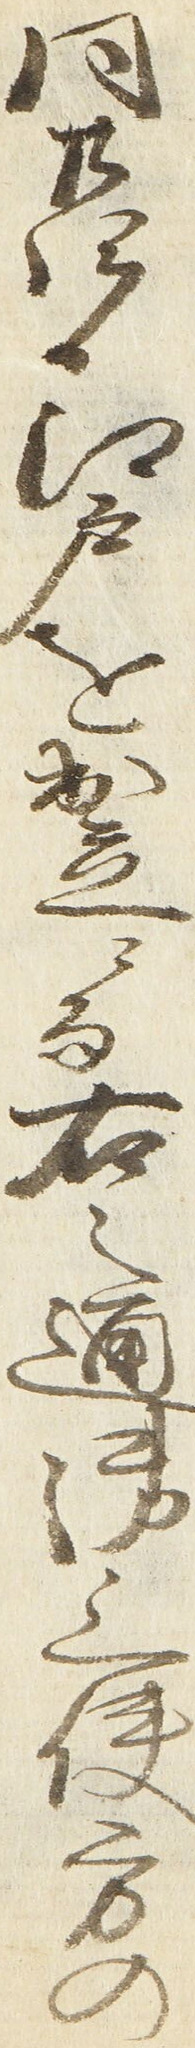同廿四日江戸を出立ニ而右之通御上使方の
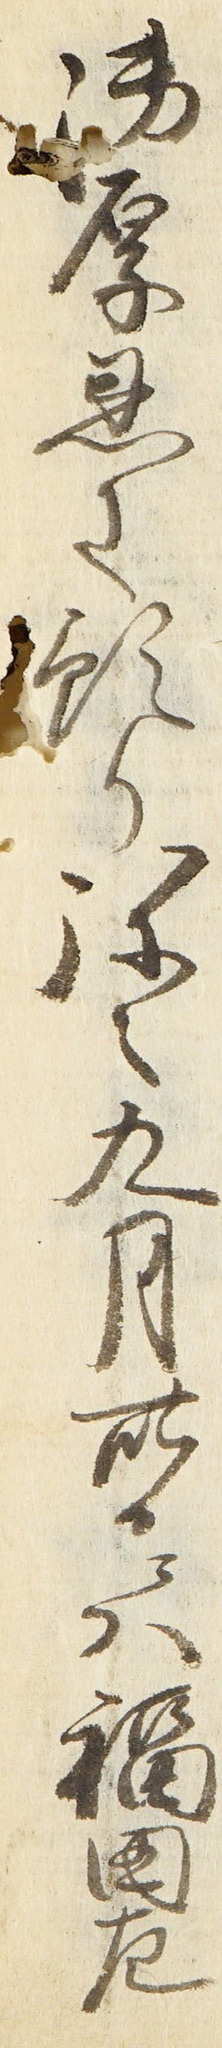御厚恩に預り弥々九月丗日ニハ福田左

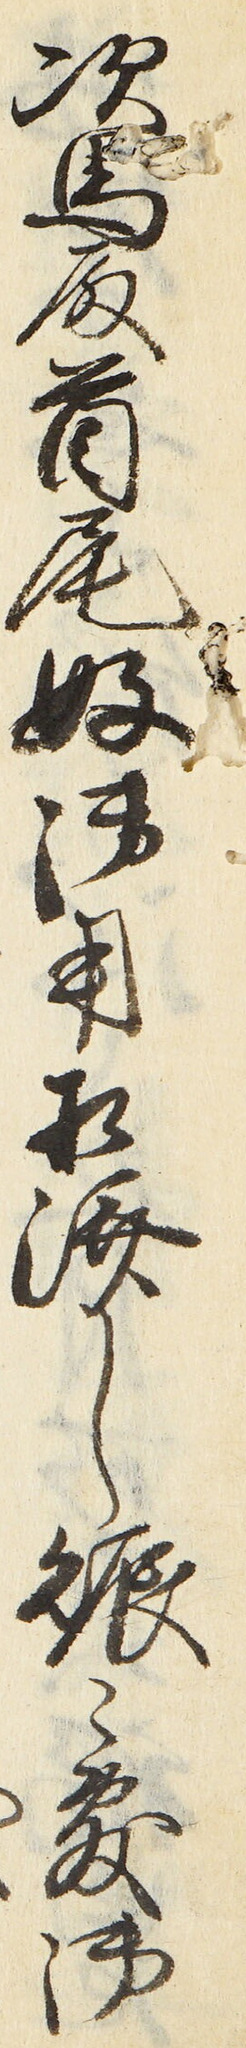次馬殿首尾好御用相済し賑々敷御
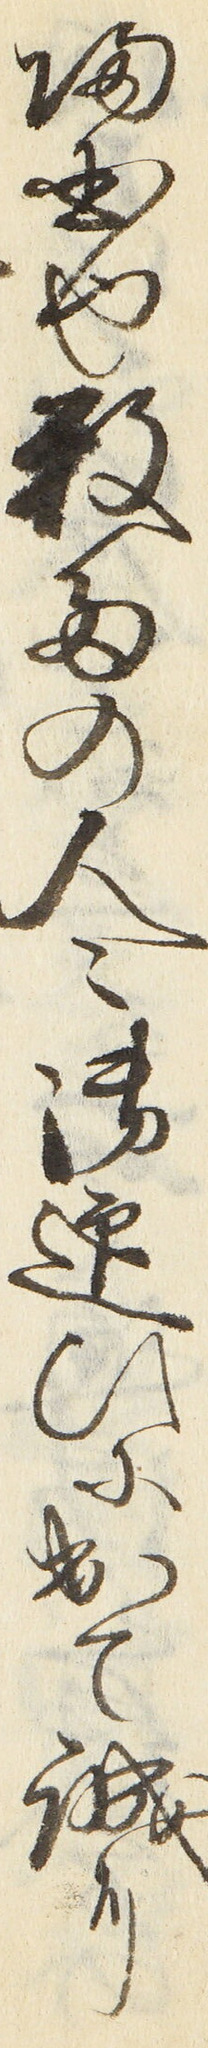帰国也数多の人々御迎ひに出て誠に
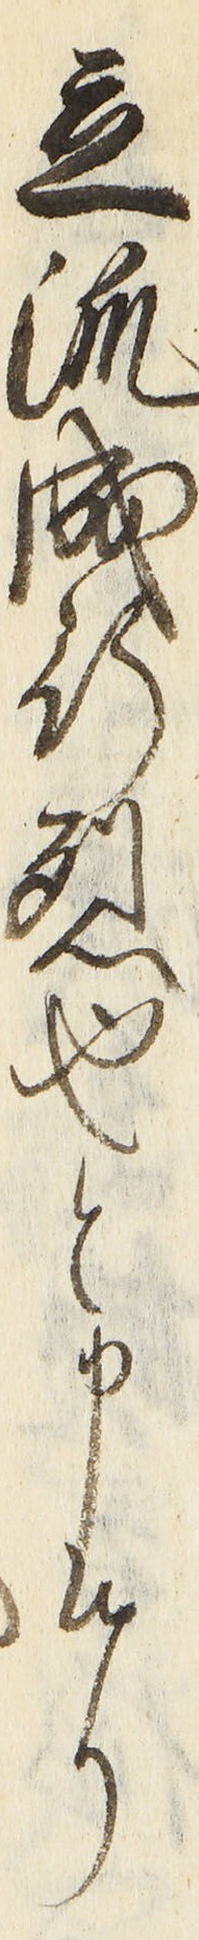立派成行烈也と申けり
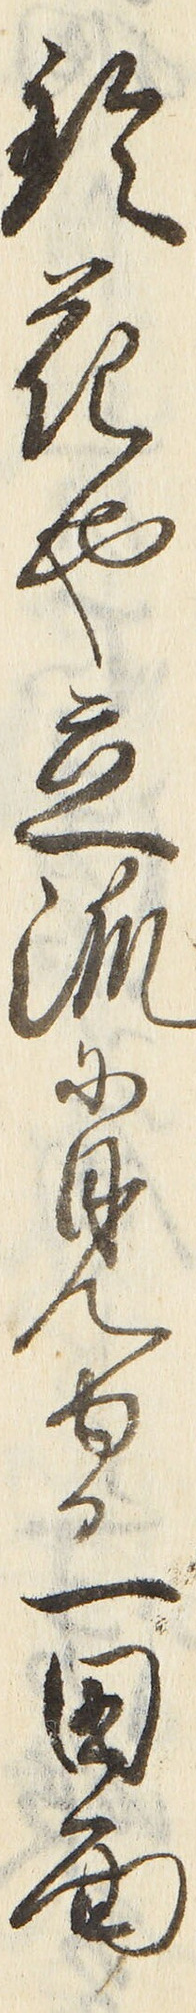珍花や立派に見ゆる一田面
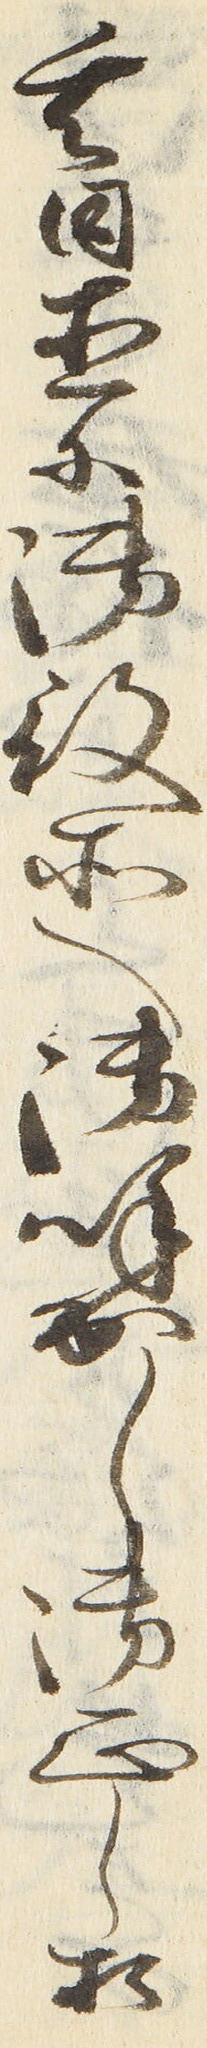其日直に御役所へ御呼出し御正し相
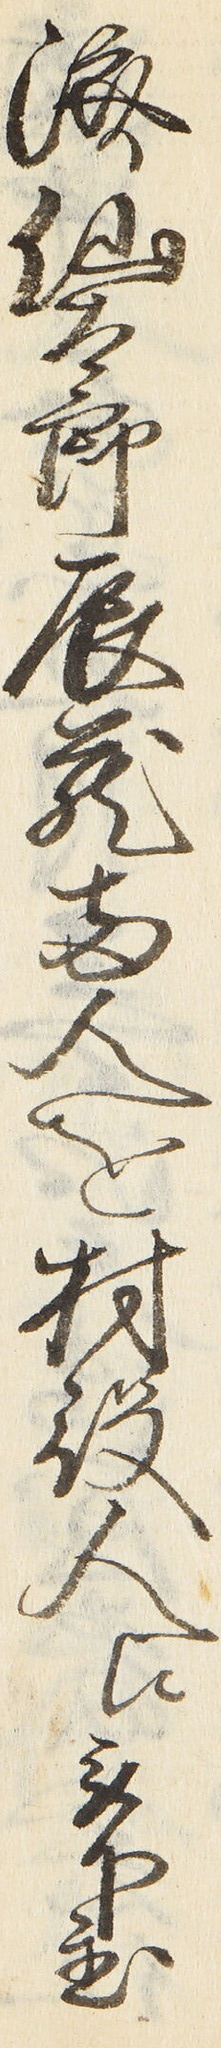済仙太郎辰蔵両人を村役人え被下置
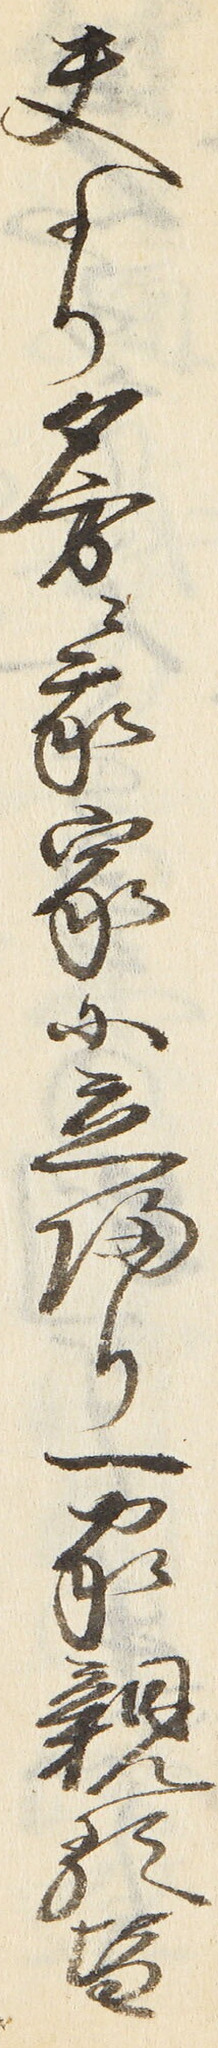夫より夕方ニ前家に立帰り一家親類皆
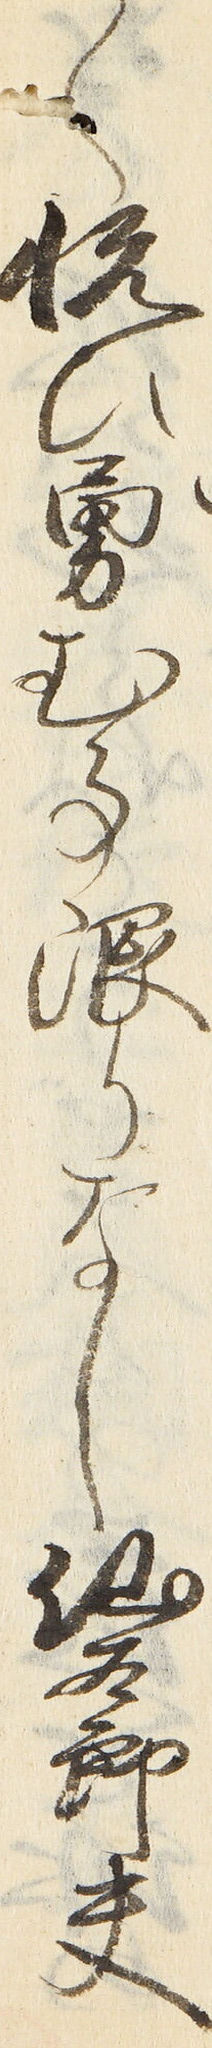〳〵悦ひ勇む事限りなし仙太郎夫
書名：天保漂流記
